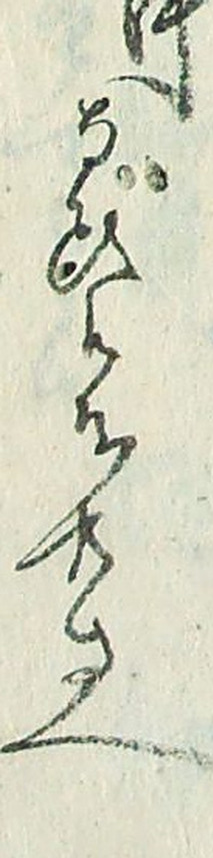与頭庄屋共方へ

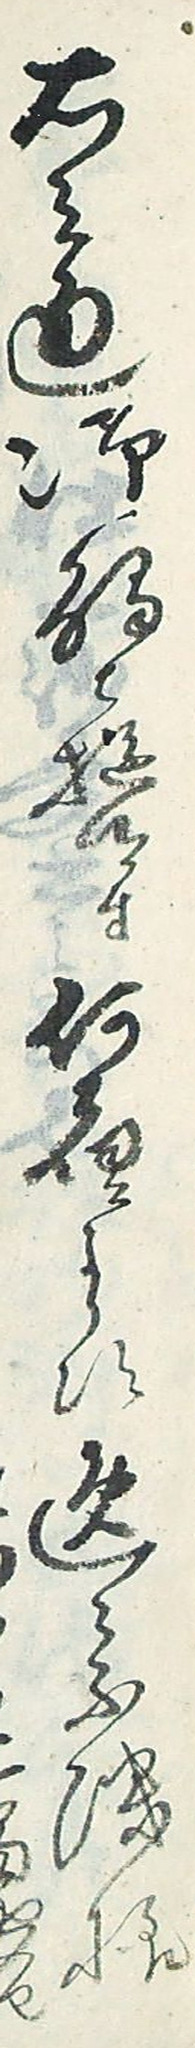右之通御触被遊候に付何者によらす逸々不洩様
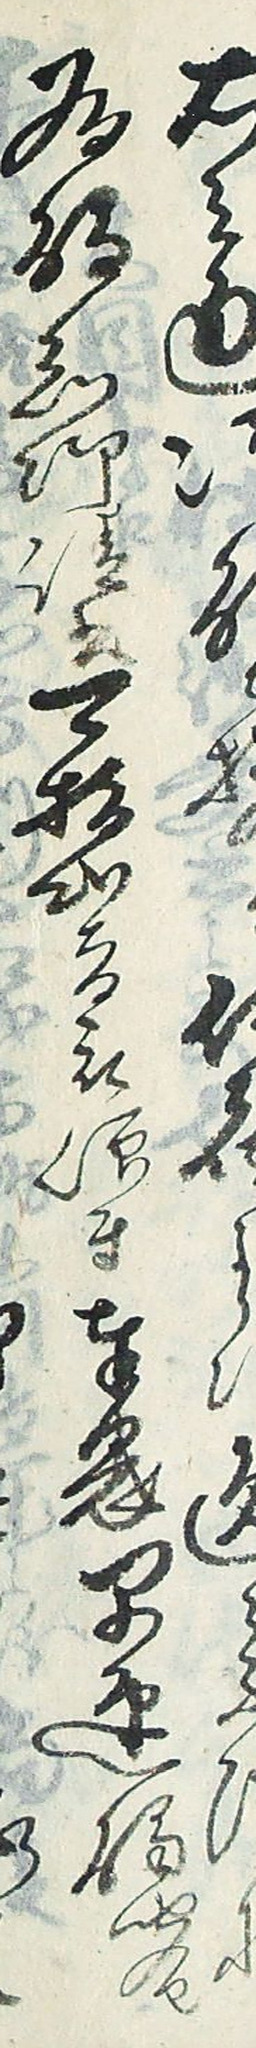為触知御請書可指出旨被仰付奉畏早速触聞せ
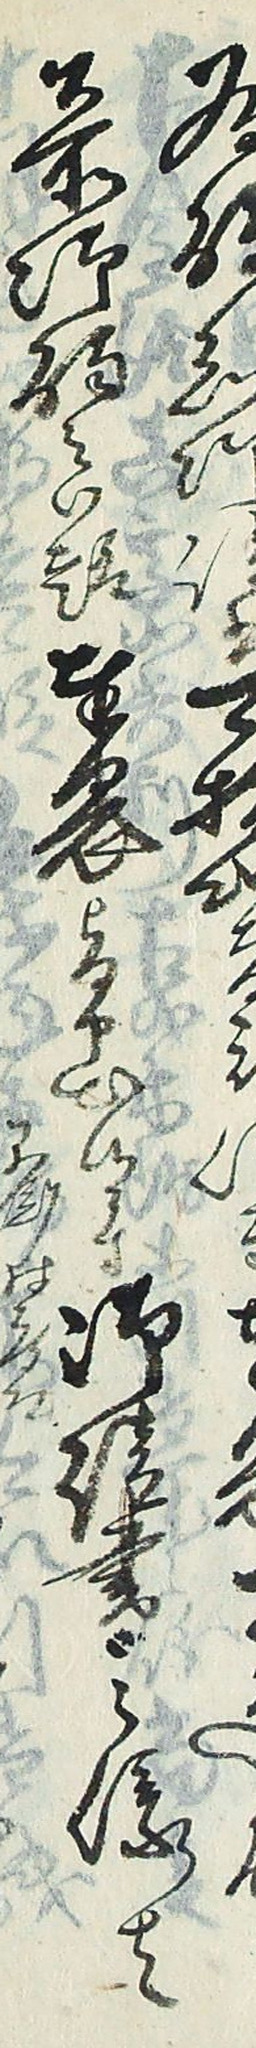候所御触之御趣奉畏旨申出候に付御請書之儀は
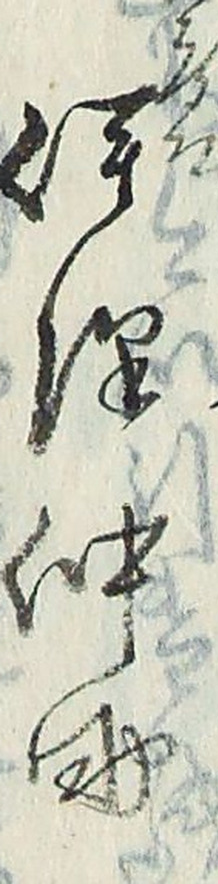伊澤仲助
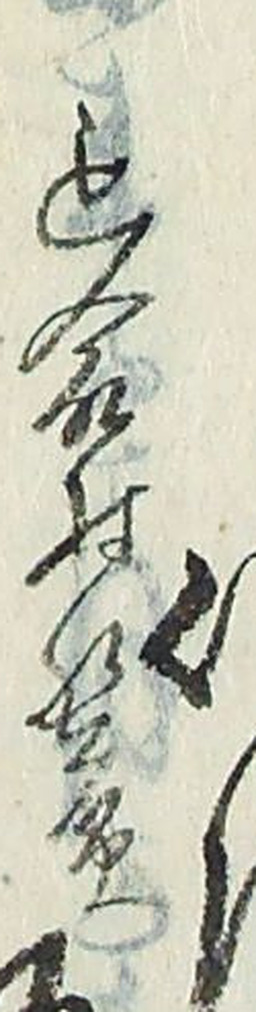延命村肝煎
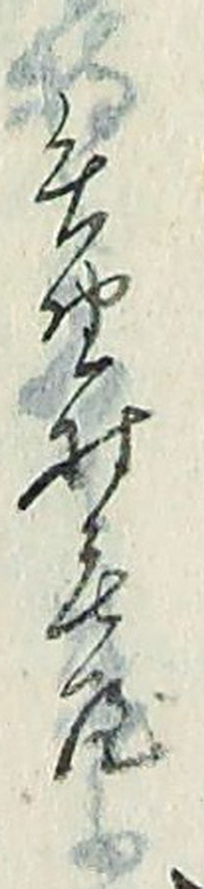矢野村庄屋
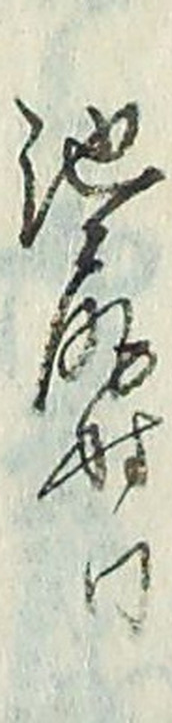池尻村同
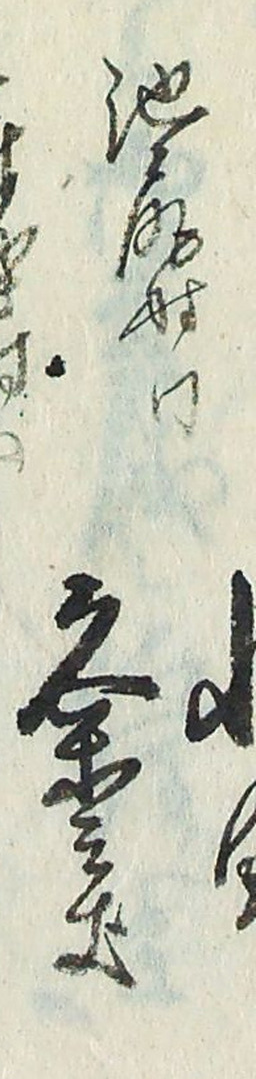久米之丈
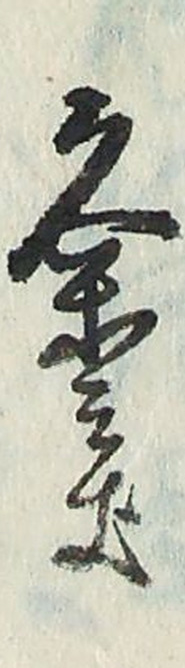久米之丈
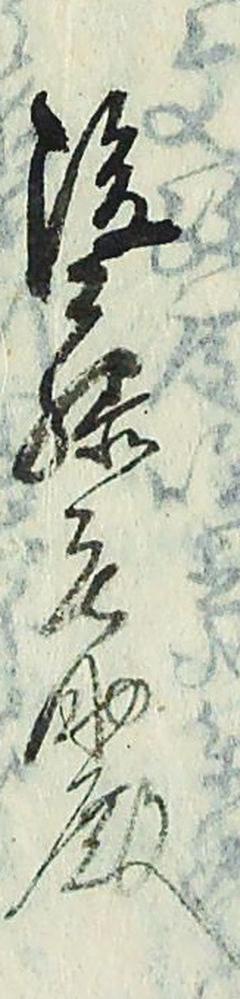後藤庄助殿
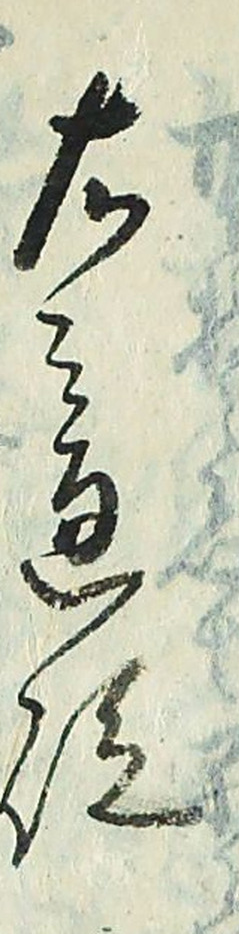右之通従
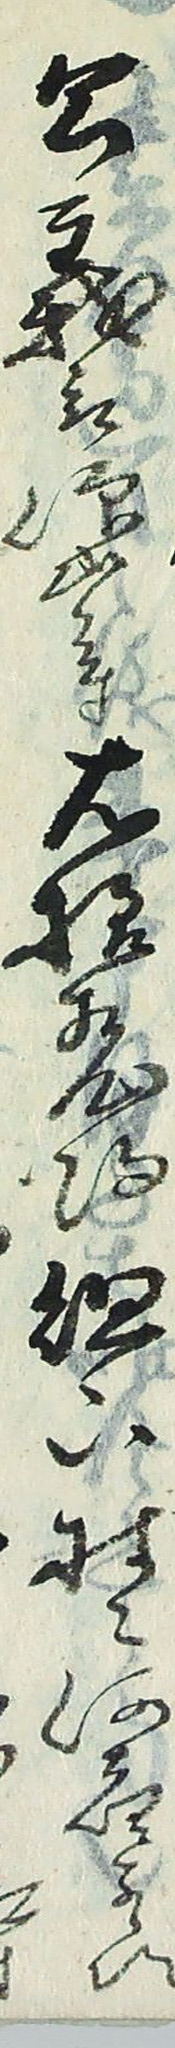公義被仰出候に付右様相心得組下村々何者によらす
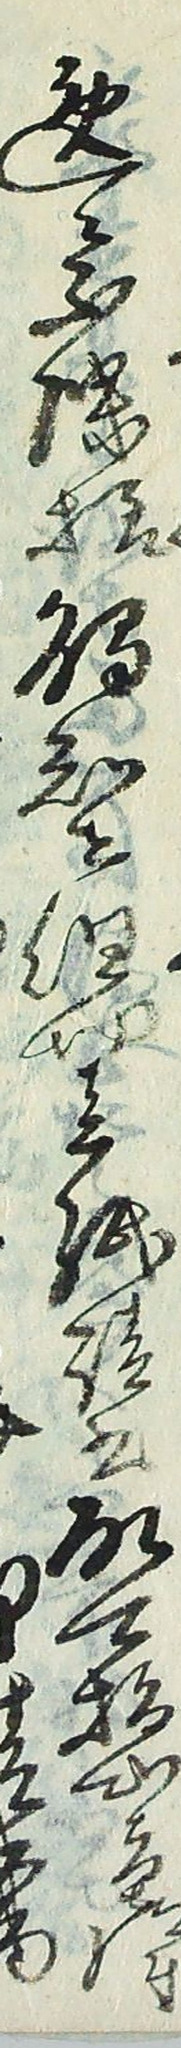逸々不洩様触知せ組切壱紙請書取可指出旨被仰付
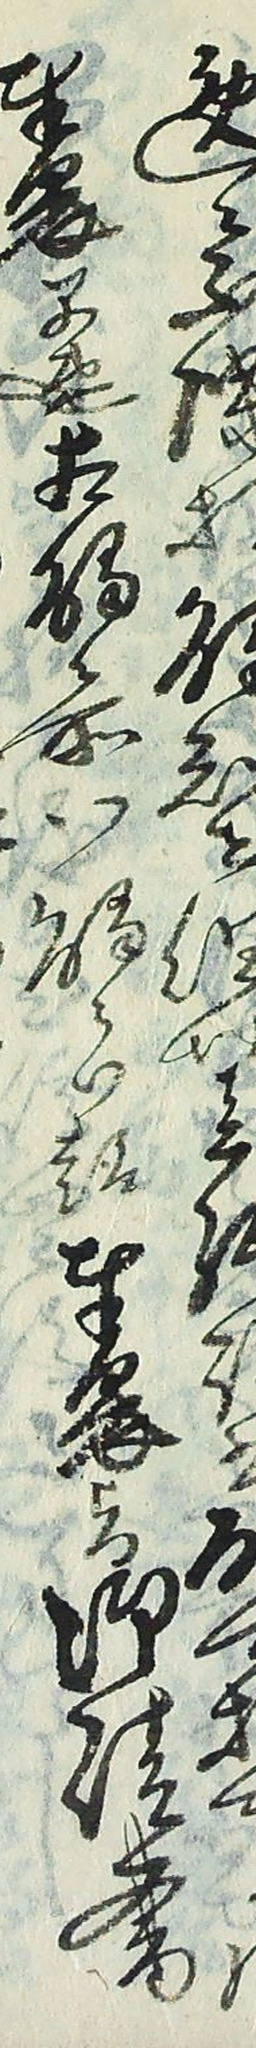奉畏早速相触候所御触之御趣奉畏旨御請書
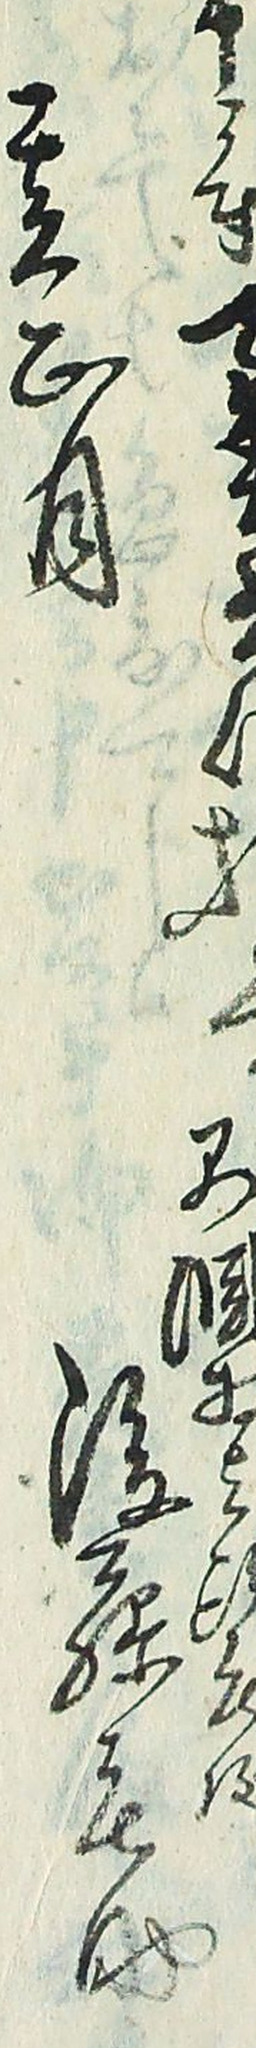亥正月後藤庄助
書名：諸御用御□受書控
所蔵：鳴門教育大学 Naruto University of Education
